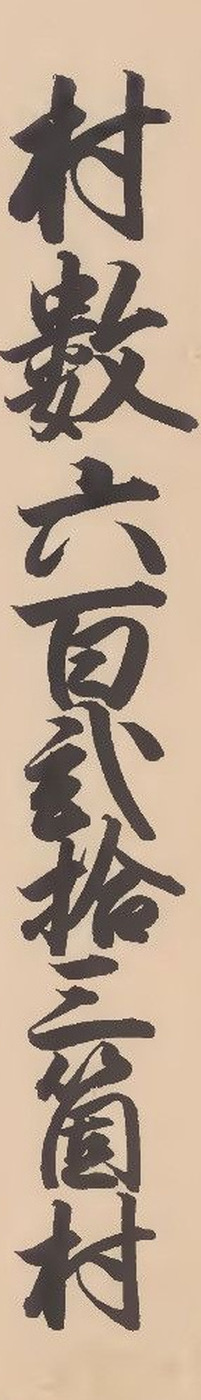村数六百弐拾三箇村
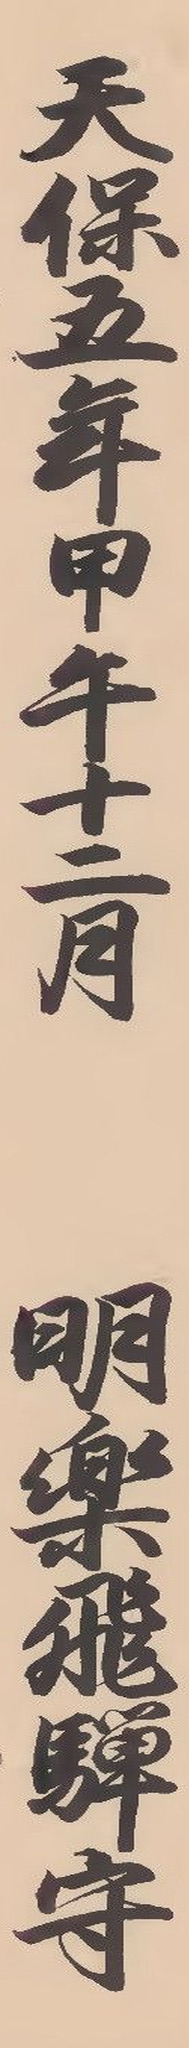天保五年甲午十二月明楽飛騨守
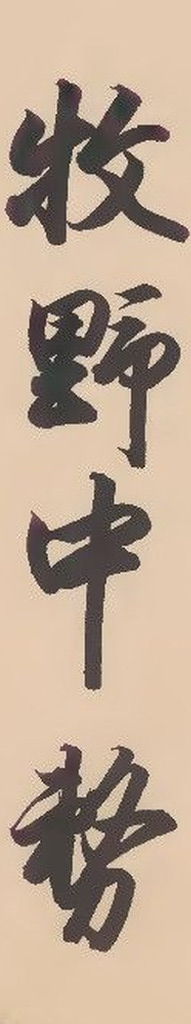牧野中務
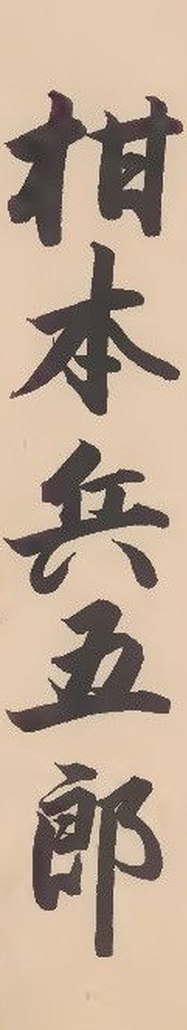相本兵五郎
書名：但馬国郷帳
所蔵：国立公文書館 National Archives of Japan
